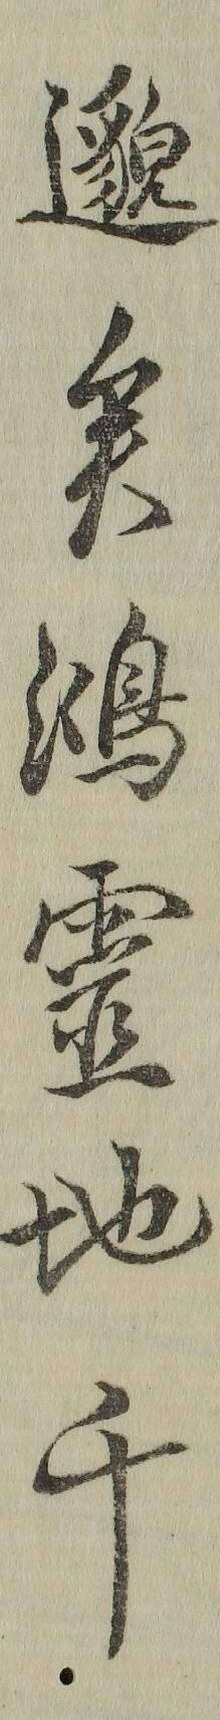邈矣鴻靈地千
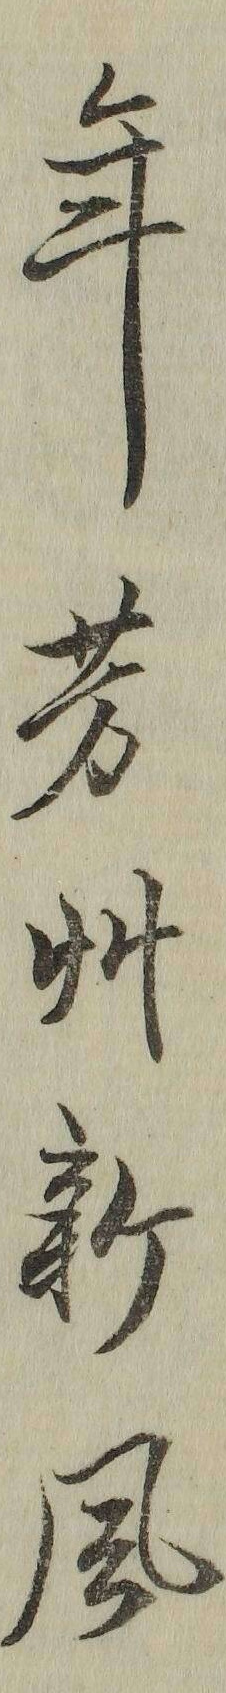年芳艸新風
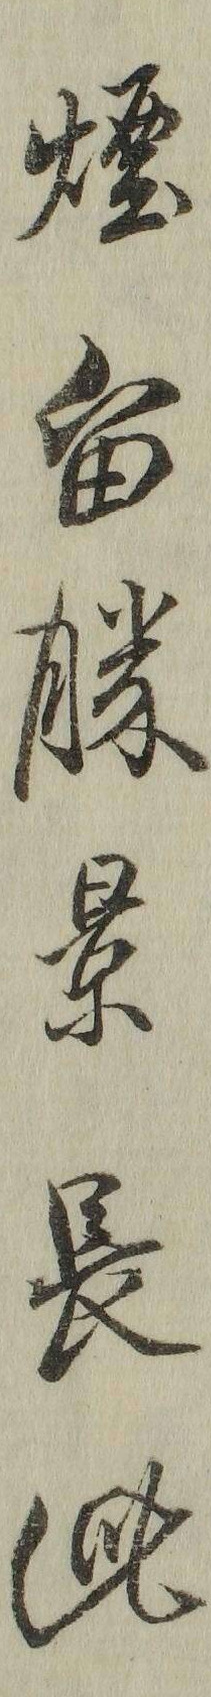煙留勝景長此

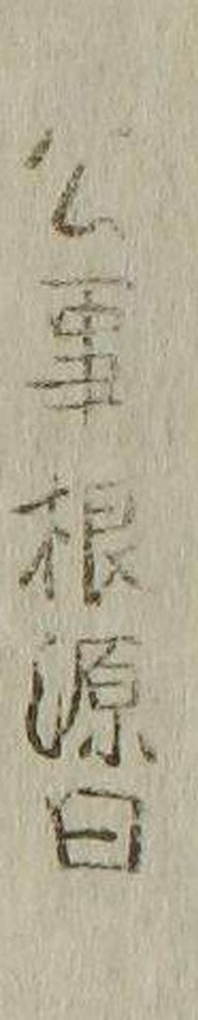公事根源曰
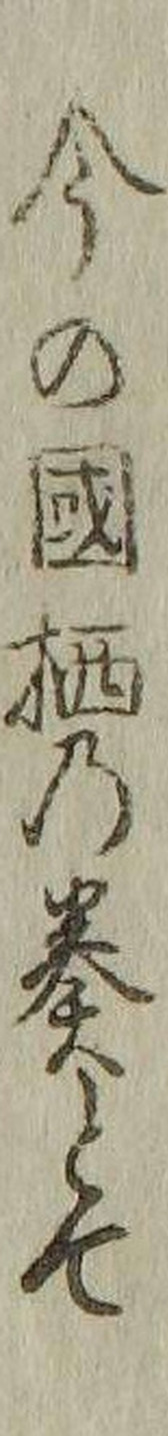今の國栖の奏とて
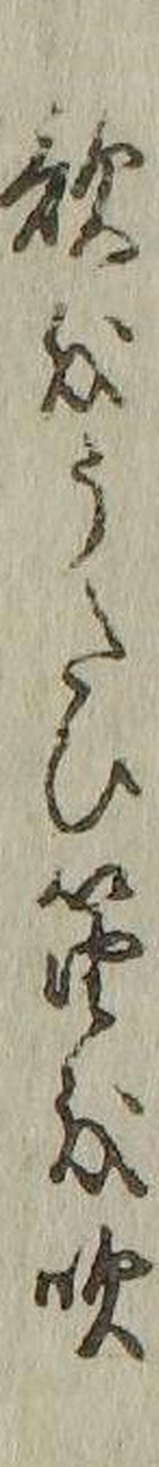歌をうたひ笛を吹
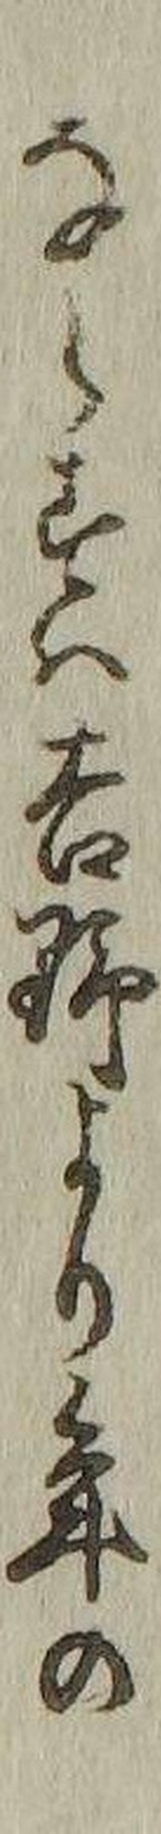ならすは𠮷野より年の
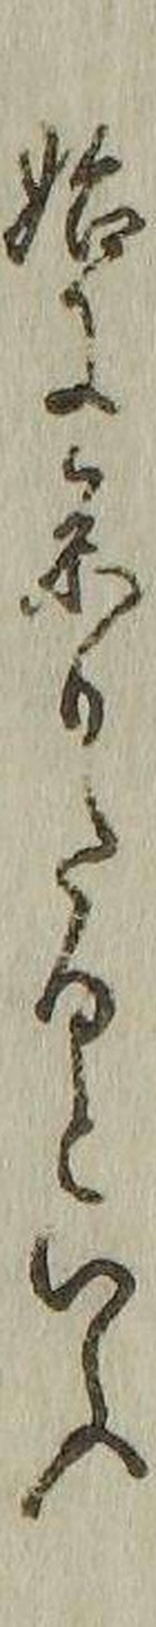始に参りたるといふ
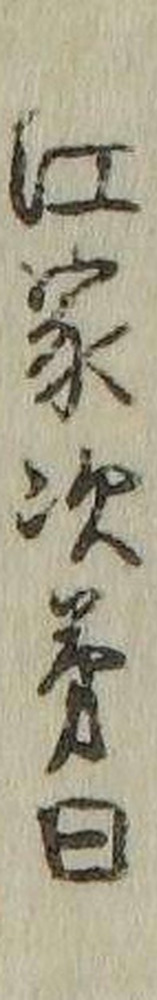江家次第曰

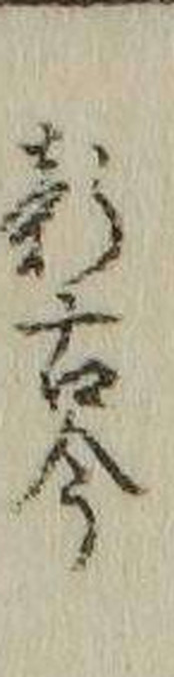新古今
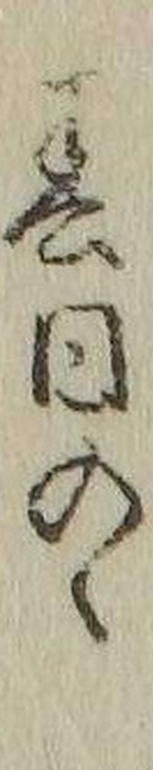春日のゝ
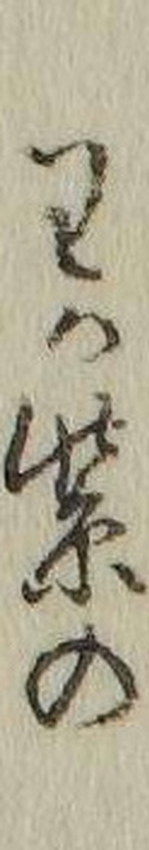わか紫の
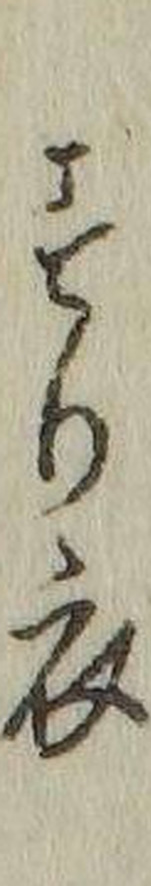すり衣
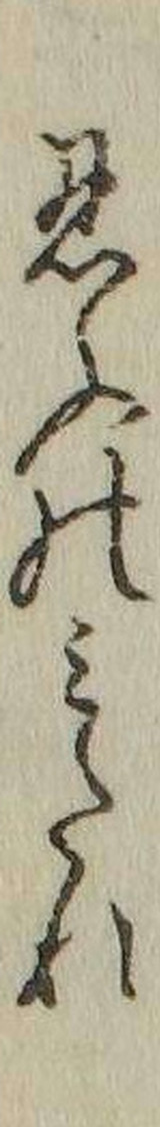忍ふのみたれ
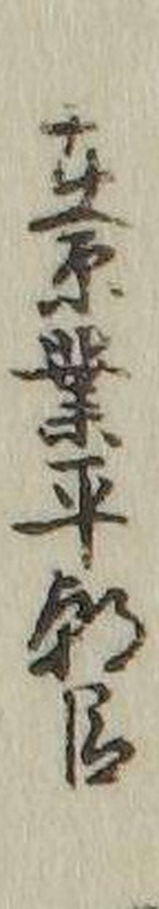在原業平朝臣

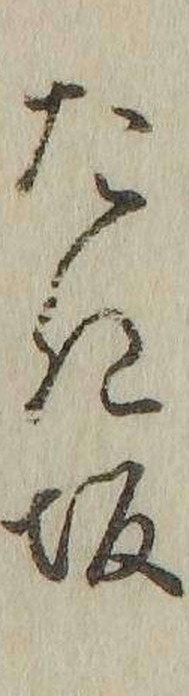たき坂
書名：大和名所圖會
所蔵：国文学研究資料館
